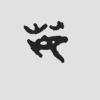𦬑
